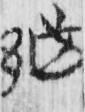○（越）
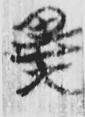異
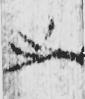之
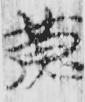黃
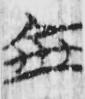金
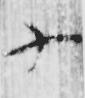七
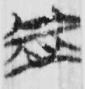益
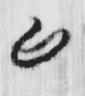㠯（以）
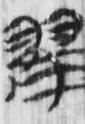翟（糴）
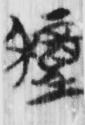穜（種）
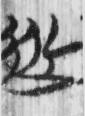迄
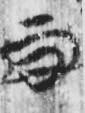○（期）
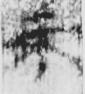不
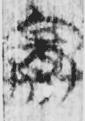賽
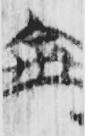金
